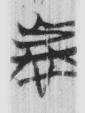者
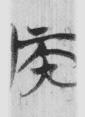侯
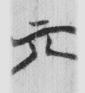亓
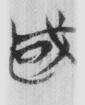或
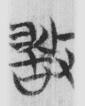敢
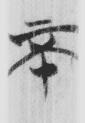不
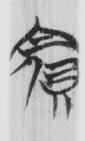賓
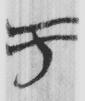于
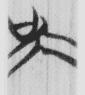吳
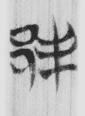邦
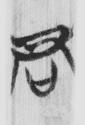君
